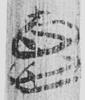惪（德）
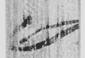㠯（以）
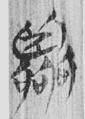臨
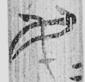民民
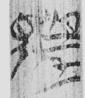○（望）
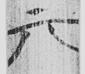亓（其）
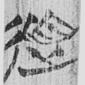道
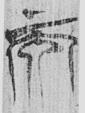而
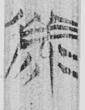備（服）
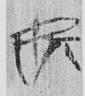𡚦
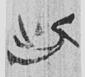此
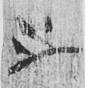之
